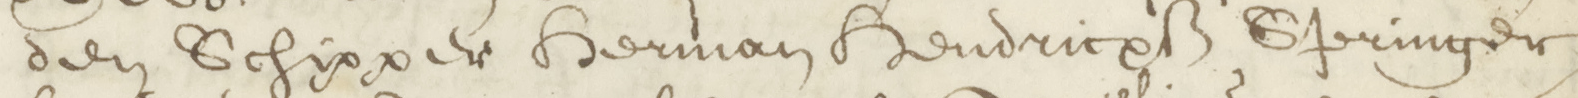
den Schipper Herman Hendricxz Springer,
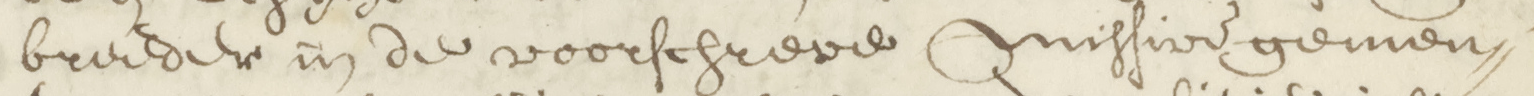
breeder in de voorschreve Missive gemen„
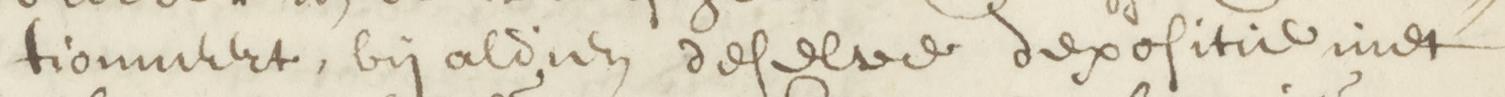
tionneert, bij aldien deselve depositie niet
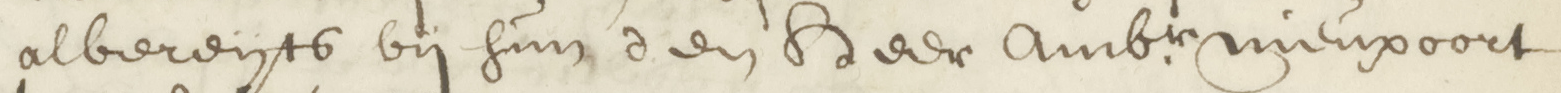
albereijts bij hun den Heere Ambr. Nieupoort
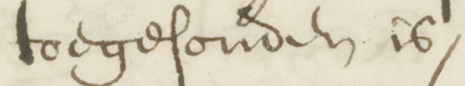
toegesonden is.
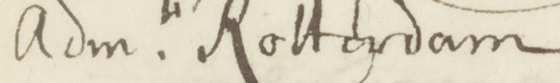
Admt. Rotterdam
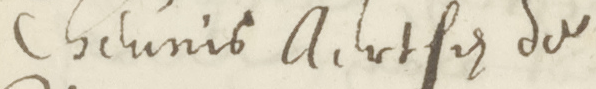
Theunis Aertsen de
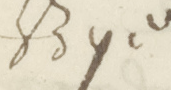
Bye
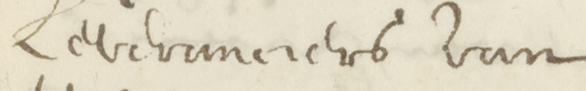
Leveranciers van
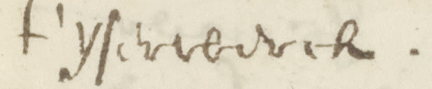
t‛ Yserwerck.
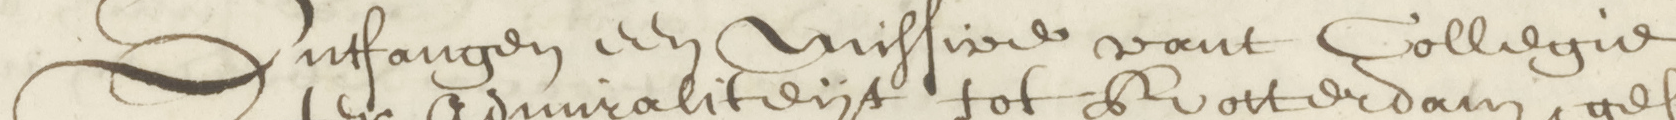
Ontfangen een Missive vant Collegie
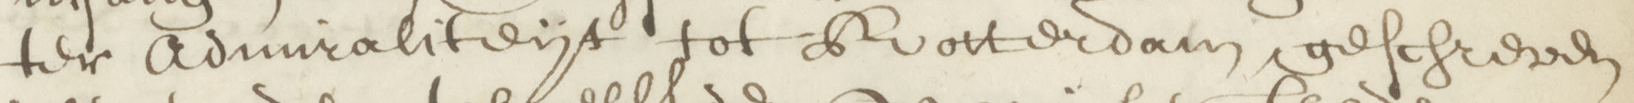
ter Admiraliteijt tot Rotterdam, geschreven
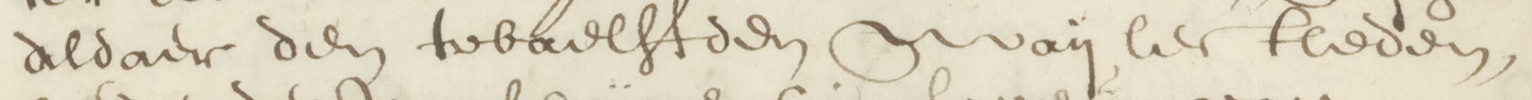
aldaer den twaelffden Maij lestleden,
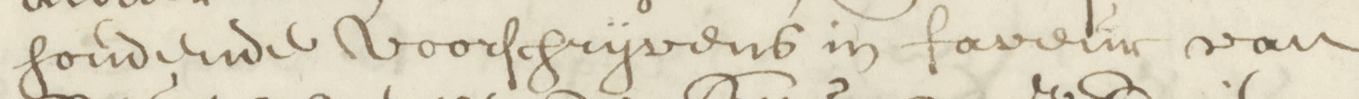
houdende voorschrijvens in faveur van
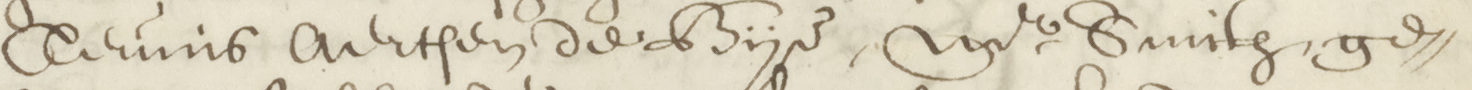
Teunis Aertsen de Bije, Mr. Smith, ge„
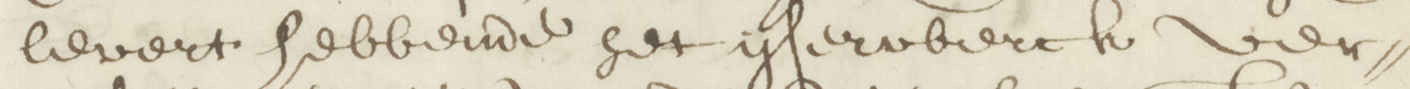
levert hebbende het ijserwerck ver„
